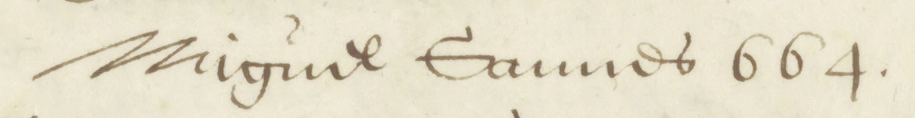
Miguel Sannes 664.
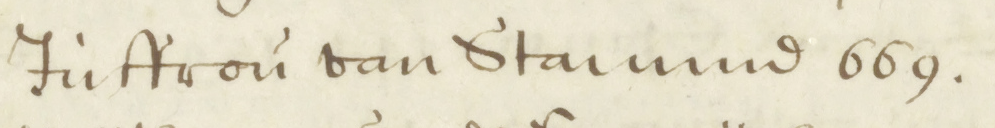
Juffrou van Stamme 669.
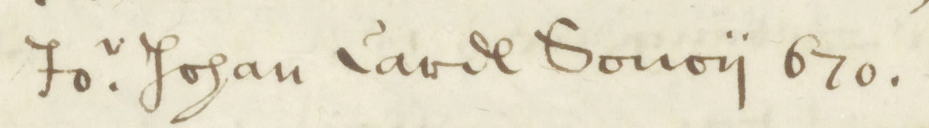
Jor. Johan Carel Sonoij 670.
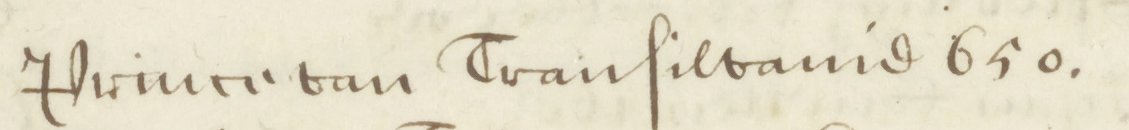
Prince van Transilvanie 650.
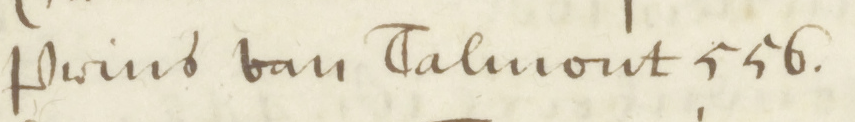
Prins van Talmont 556.
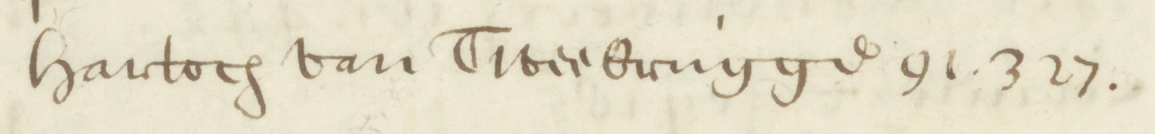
hartoch van Tweebrugge 91. 327.
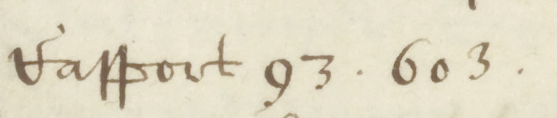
Rapport 93. 603.
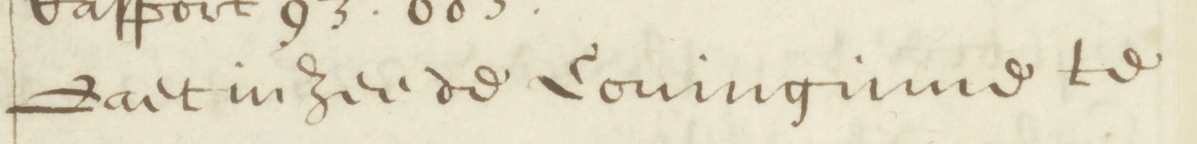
Raet in Zee de Coninginne te
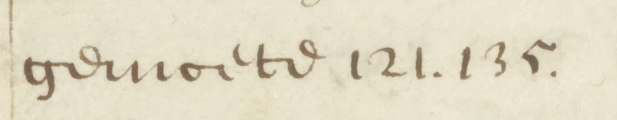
gemoete 121. 135.
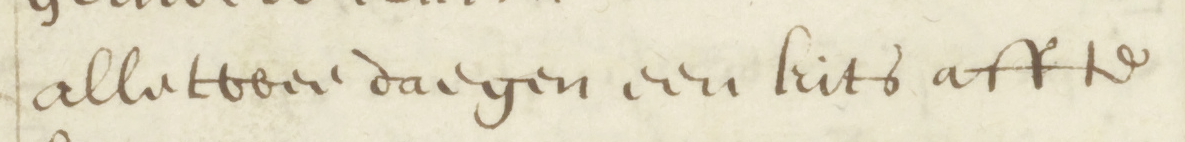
alle twee daegen een kits aff te
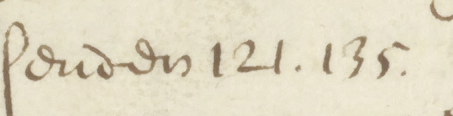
senden 121. 135.
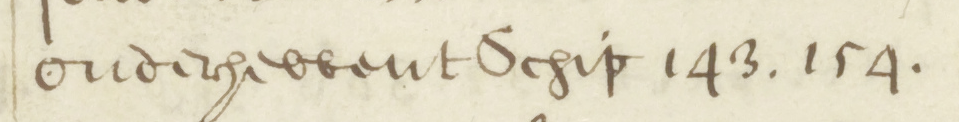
onderhebbent Schip 143. 154.
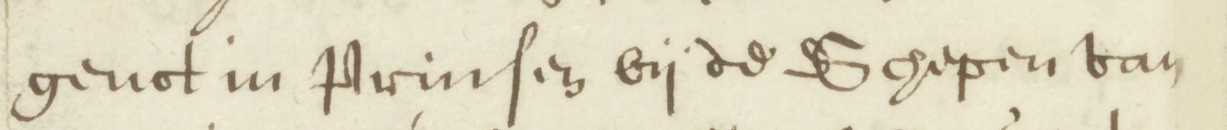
genot in Prinsen bij de Schepen van
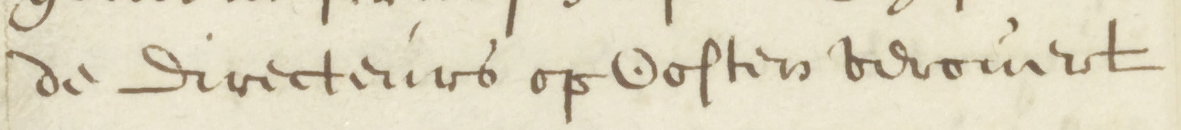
de Directeurs op Oosten verouert
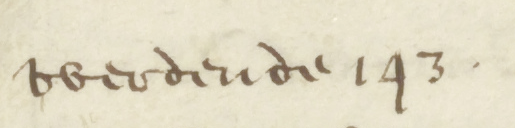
werdende 143.
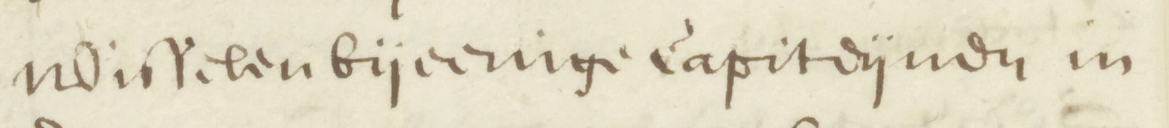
Wisselen bij eenige Capiteijnen in
